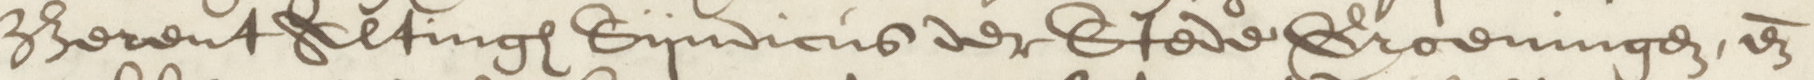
Berent Altingh Sijndicus der Stede Groeningen, en
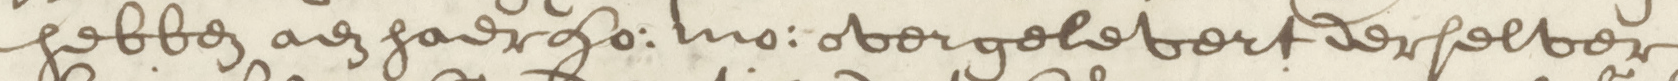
hebben aen haer Ho:mo: overgelevert derselver
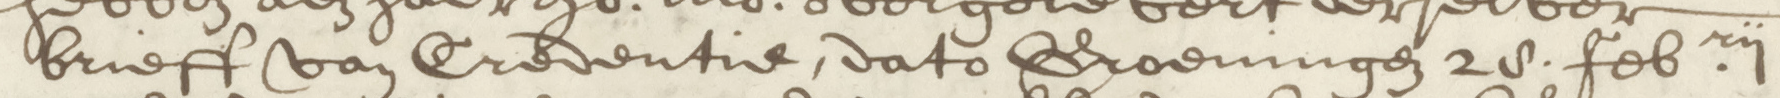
brieff van Credentie, dato Groeningen 28 febrij
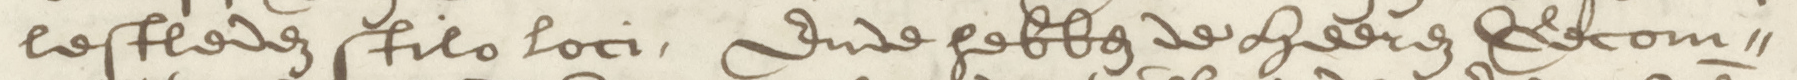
lestleden stilo loci. Ende hebben de Heeren Gecom„
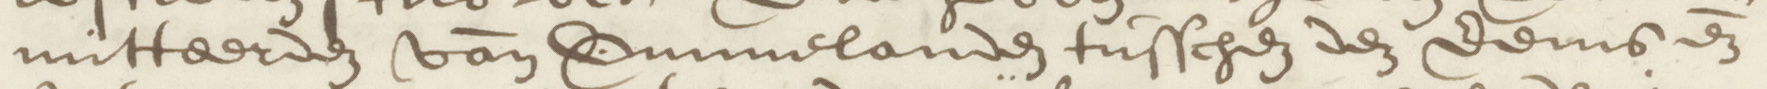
mitteerden van Ommelanden tusschen den Eems en
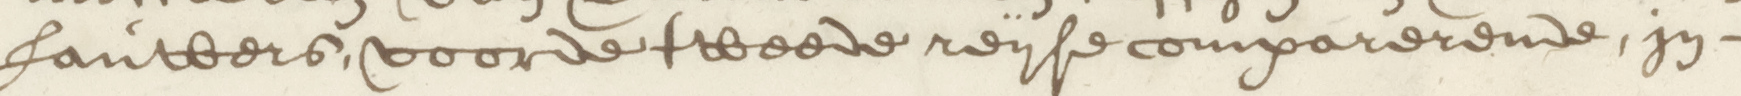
Lauwers. voor de tweede reijse comparerende, in —
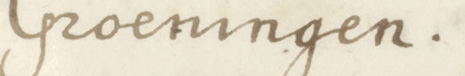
Groeningen.
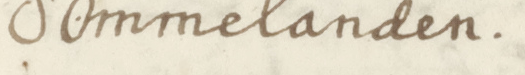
d‛Ommelanden
